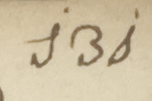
136
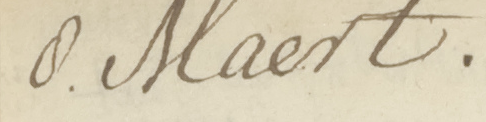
8. Maert
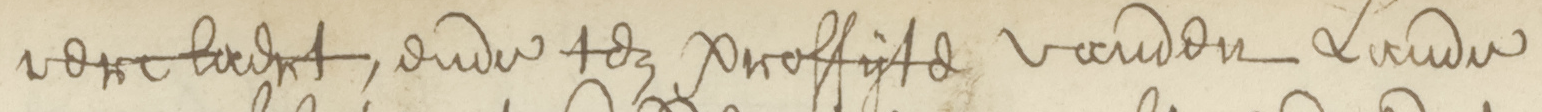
verclaert, ende ten proffijte vanden Lande
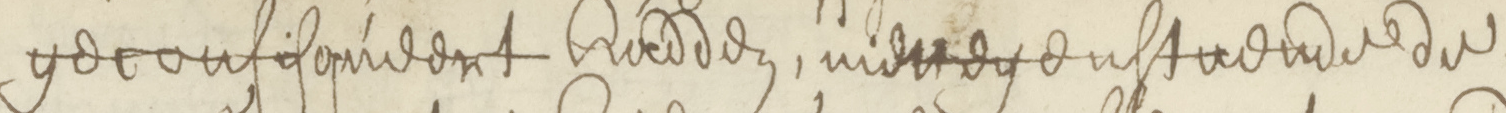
geconfisqueert hadden, niettegenstaende de
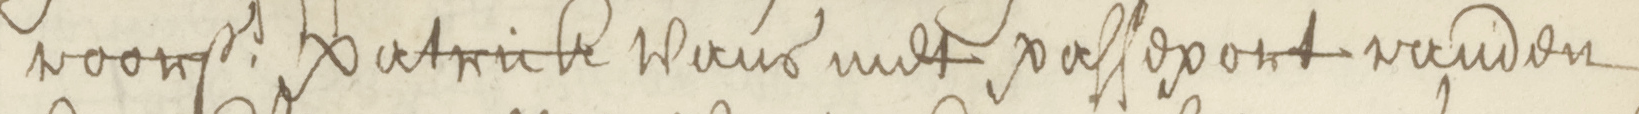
voors. Patrick Vans met passeport vanden
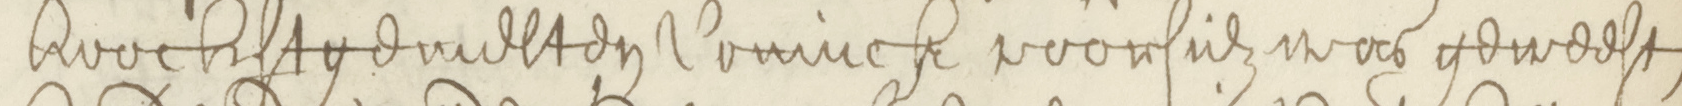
hoochstgemelten Coninck voorsien was geweest,
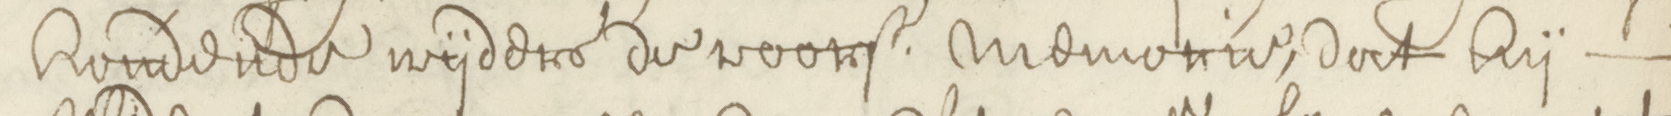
houdende wijders de voors. memorie, dat hij
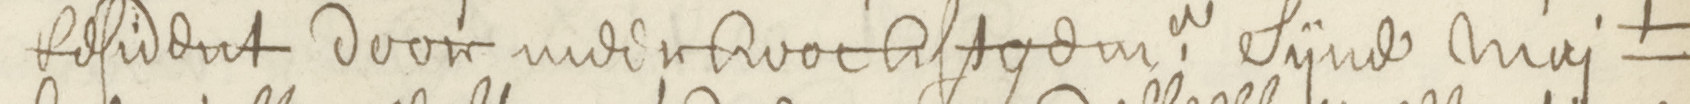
resident door meerhoochstgem.e Sijne Majt
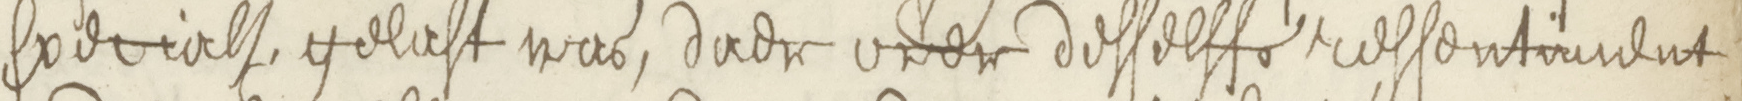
special gelast was, daer over desselffs ressentiment
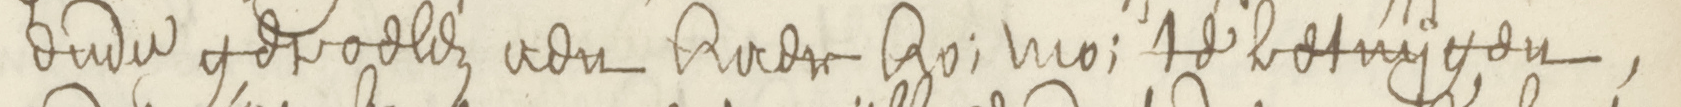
ende gevoelen aen haer Ho:Mo: te betuijgen,
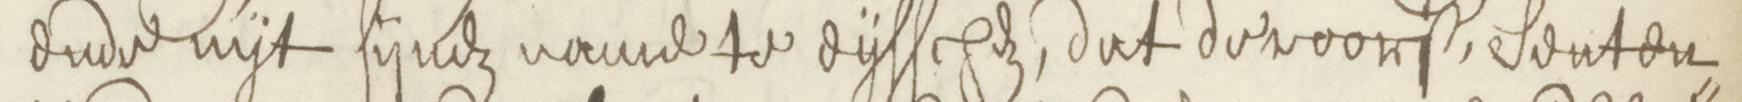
ende uijt sijnen name te eijsschen, dat de voors. senten„
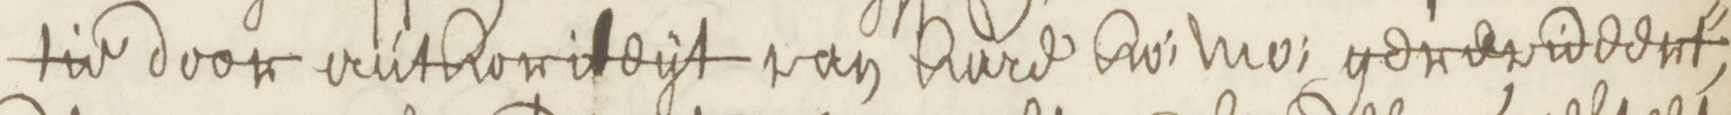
tie door authoriteijt van hare Ho:Mo: gerevideert,
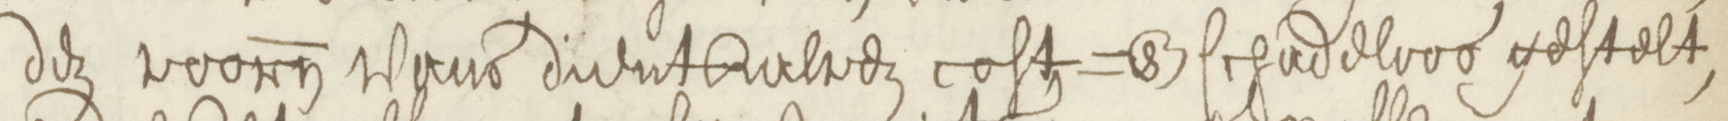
den voorn Vans dienthalven cost=& schadeloos gestelt,
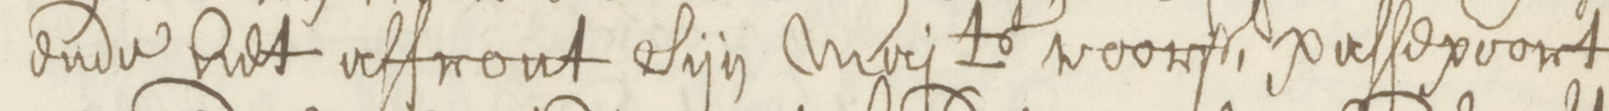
ende het affront Sijn Majts voors. passepoort
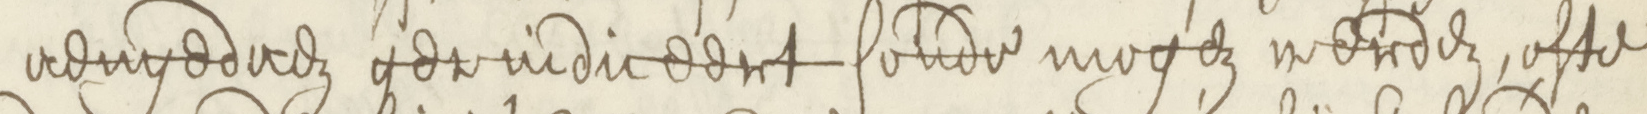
aengedaen gevindiceert soude mogen werden, ofte
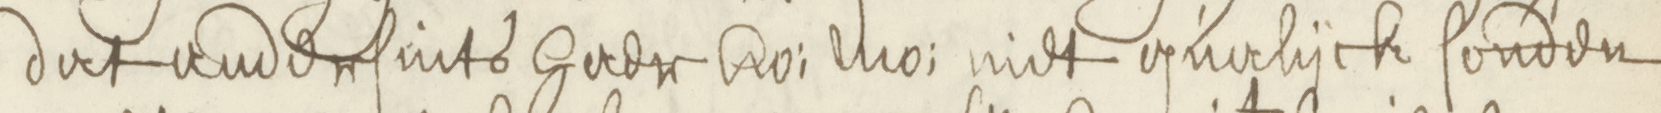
dat andersints haer Ho:Mo: niet qualijck souden
